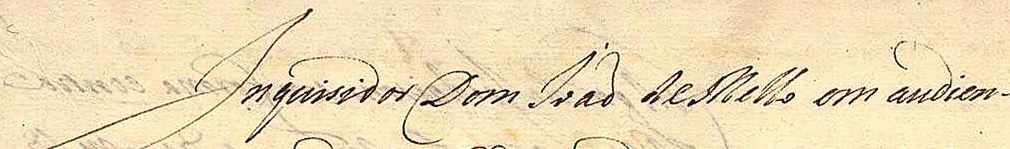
Jnquisidor Dom Ioão de Mello em audien
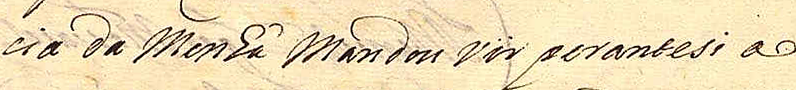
cia da menhā mandou vir perante si a
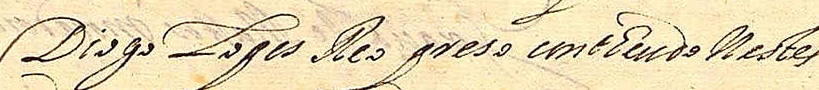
Diogo Lopes Reo preso contheudo Nestes
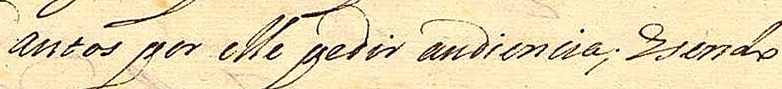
autos por elle pedir audiencia; E sendo
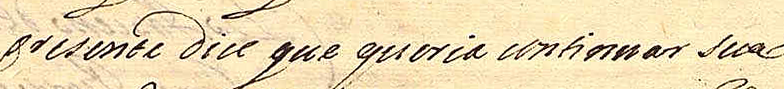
presente dice que queria continuar sua
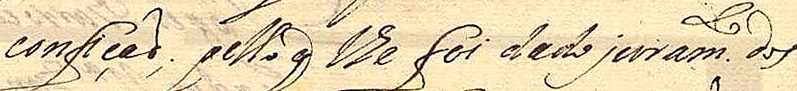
confição; pello q̄ lhe foi dado juramto. dos
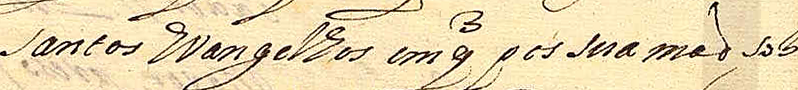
santos Evangelhos em q̄ pos sua mão, sob
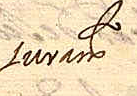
juramto
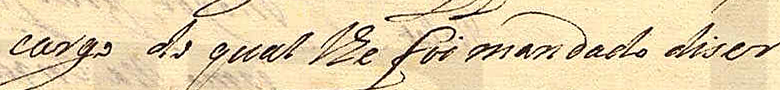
cargo do qual lhe foi mandado diser
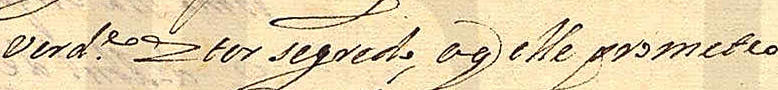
verd.e E ter segredo, o q̄ elle prometeo
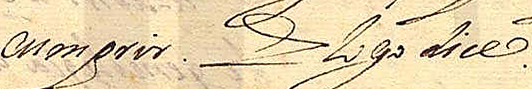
cumprir. E logo dice.
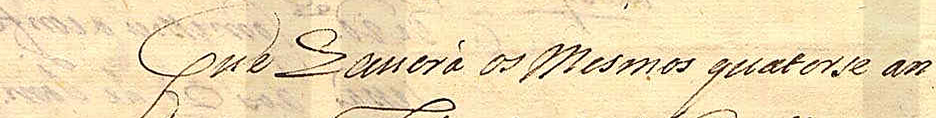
Que hauera os Mesmos quatorse an
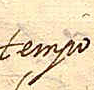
tempo
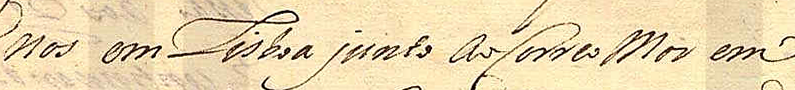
nos em Lisboa junto ao Correo Mor em
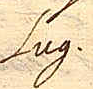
Lug.
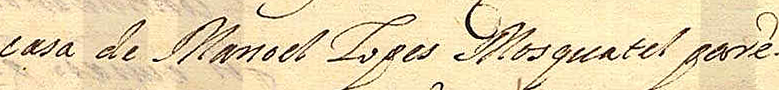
casa de Manoel Lopes Mosquatel parē
